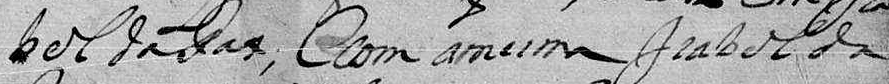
bel da Pax; E com a mesma Jzabel da
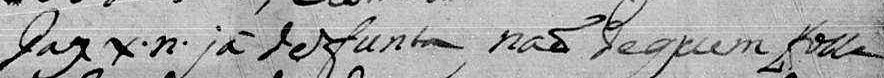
Pax x. n. já defunta, naõ de quem fosse
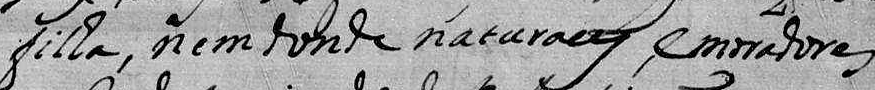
filha, nem donde naturaees, e moradores
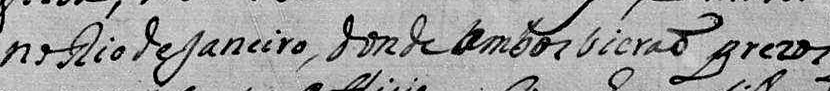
no Rio de Janeiro, donde ambos vieraõ prezos pa
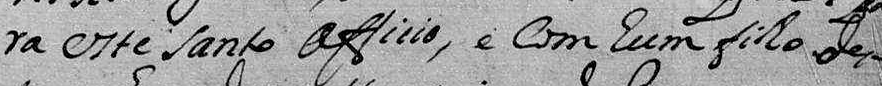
ra este santo officio, e Com hum filho des
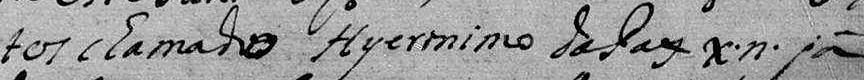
tes chamado Hyeronimo da Pax x. n. já
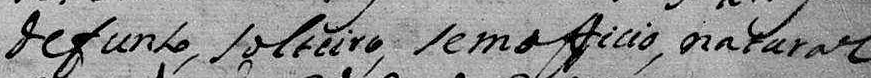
defunto, solteiro, sem officio, natural
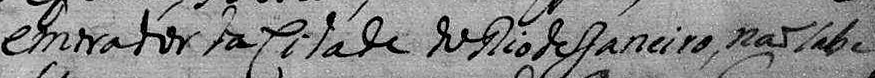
e morador da Cidade do Rio de Janeiro, naõ sabe
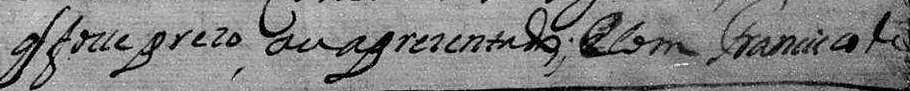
q̄ fosse prezo, ou aprezentado; E com Francisco de
